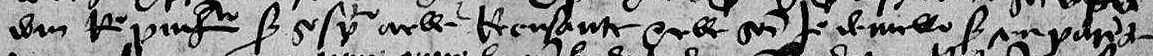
dom Ro pinhro ꞩ sospto a elle Recusante e elle sor̄ Jo de mello ꞩ seu parēte
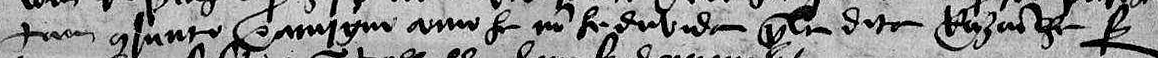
tam ꝯJunto e amjguo como he nō he duvida p̄la dita Razaõ lhe ꞩ
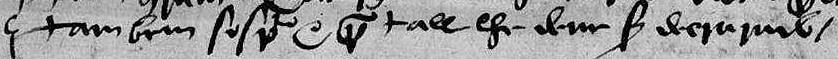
tambem sospto e p̄o tall lhe deue ꞩ decrarado /
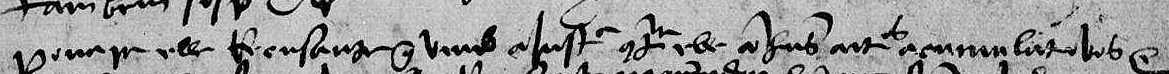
Ꝓouara elle Recusante q̄ vindo a Justa ꝯtra elle cō hus̄ artos acumulativos ē
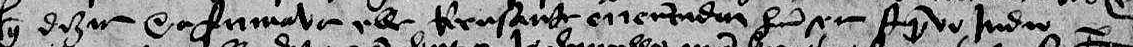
q̄ dizia e afirmava elle Recusante circūcidar hū seu stp̄vo Jndio ꝑ
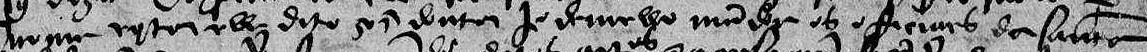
nome eytor elle dito sor̄ doutor Jo de mello mādou os oficiaes da santa
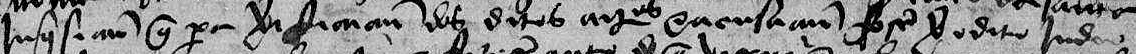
Jnq̄siçaõ q̄ ꝑa ꝟificaçaõ dos ditos artos e acusaçaõ fosē ꝟ o dito Jndio
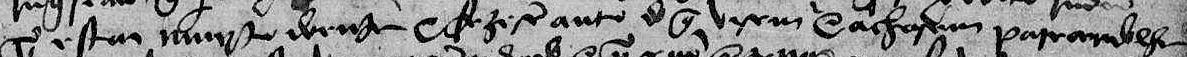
p̄o estar muyto doente e fezesē auto do q̄ visem e achasem parecendolhe
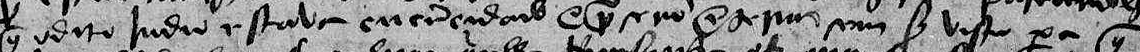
q̄ o dito Jndio estava circūcidado e p̄o se nō ēterrar sem ꞩ visto ꝑa q̄
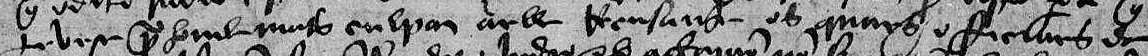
tevese p̄o honde mais culpar a elle Recusante os quays oficiaes da
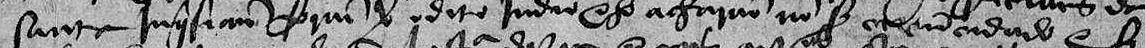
santa Jnqisiçaõ foraõ ꝟ o dito Jndio e ho acharaõ nō ꞩ circūcidado e ꞩ
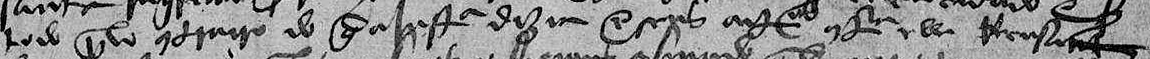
todo p̄lo ꝯtrairo do q̄ a Justa dizia ē seus artos ꝯtra elle Recusante
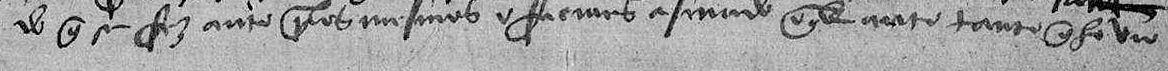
do q̄ se fez auto p̄los mesmos oficiaes asinado o q̄ll auto tanto q̄ ho vio
